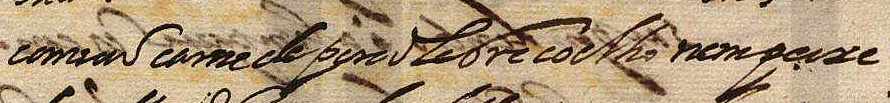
comiaõ carne de porco lebre coelho nem peixe
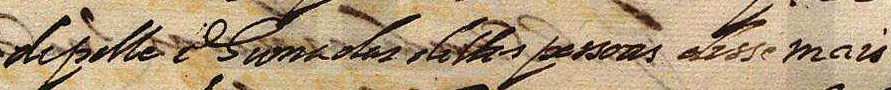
de pelle e huma das dittas pessoas disse mais
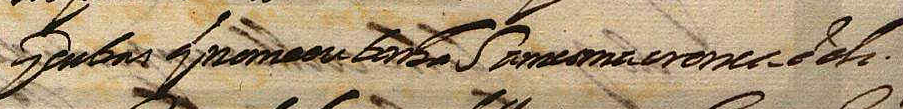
q̄ outras q̄ nomeou tinhaõ a mesma crença e de
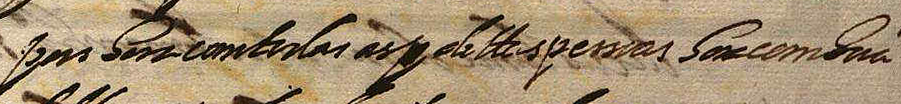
pushera com todas as ꝑdittas pessoas hor com huã
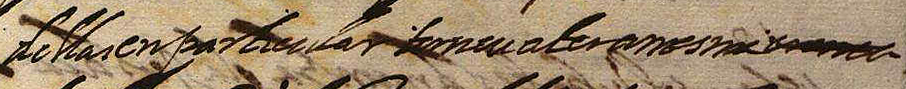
dellas en particular tornou a ter a mesma crença
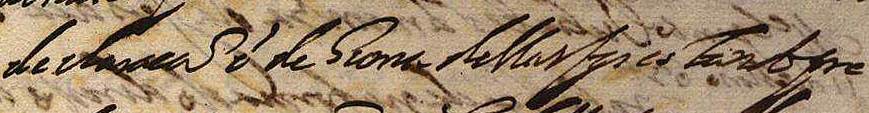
declaraçaõ e de huma dellas foi estando pre
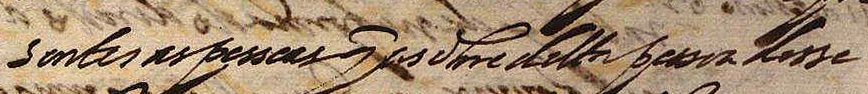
sentes as pessoas q̄ a sobreditta pessoa disse
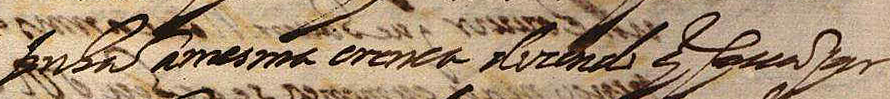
tinhaõ a mesma crença dizendo q̄ fasiaõ por
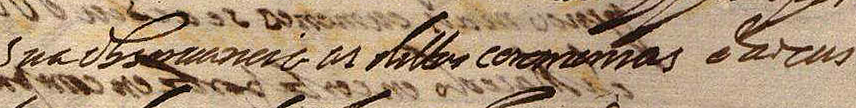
sua obseruancia as dittas ceremonias e ao cus
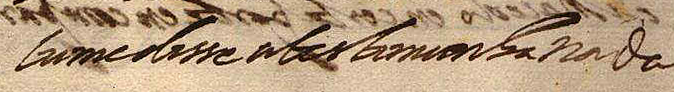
tume disse a testemunha nada
